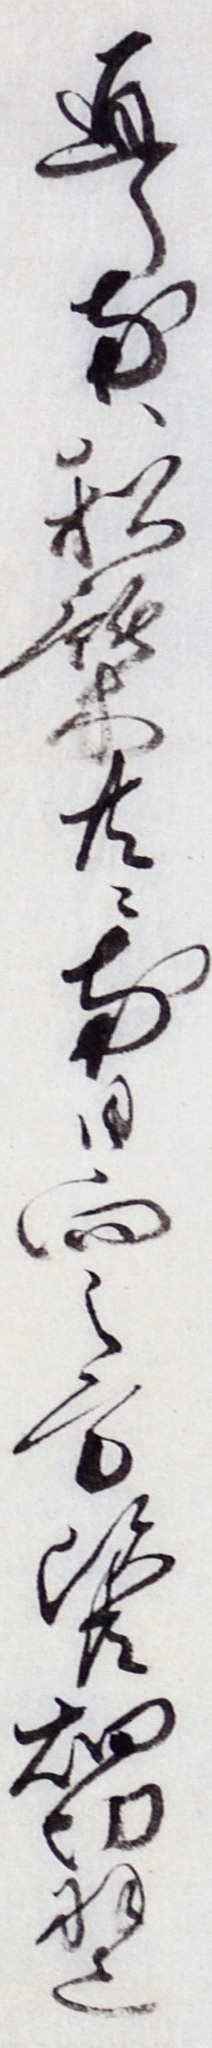通り南ハ松雑木共ニ南日向之方共畑切羽迄
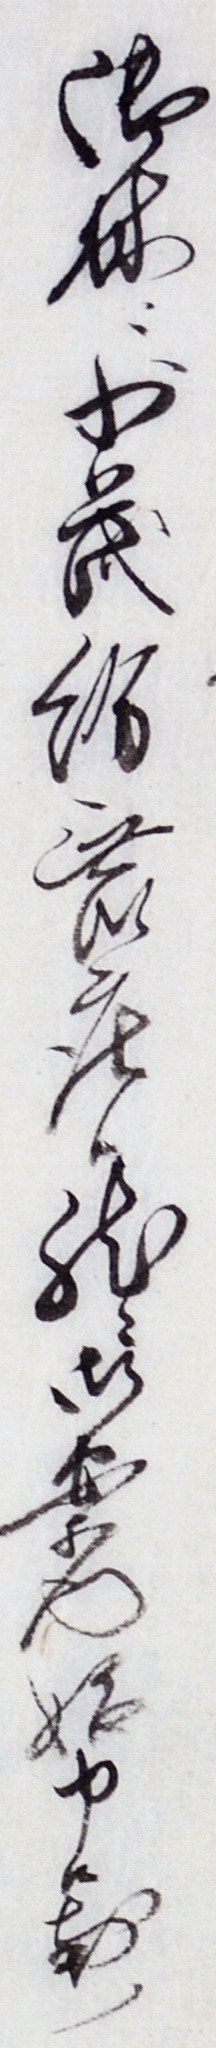御林ニ少も紛無御座候然ニ御案内始申候南ノ
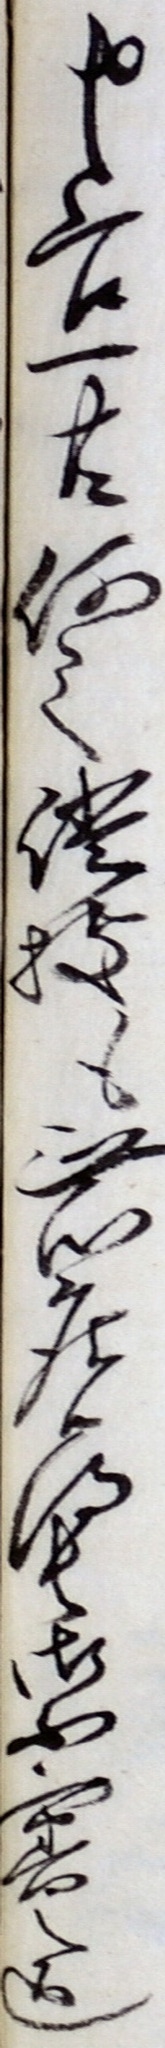申上候へ共何之証拠も無御座候得は御不審之通
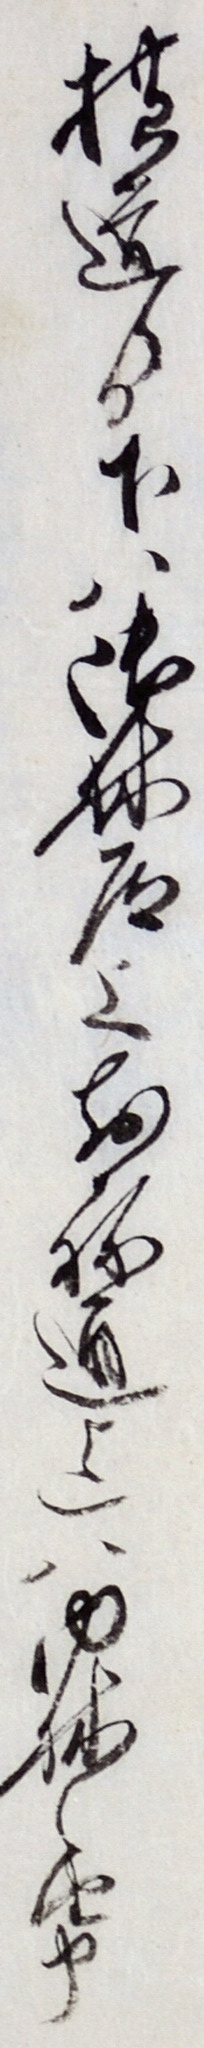横道ゟ下ハ御林道上おね道迄ハ内林之由申
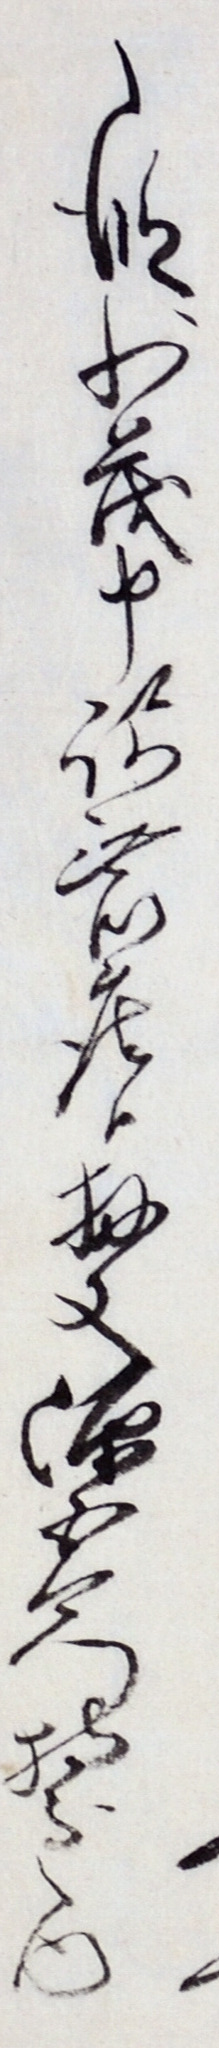候段少も申訳無御座候扨又源五右衛門持分之内
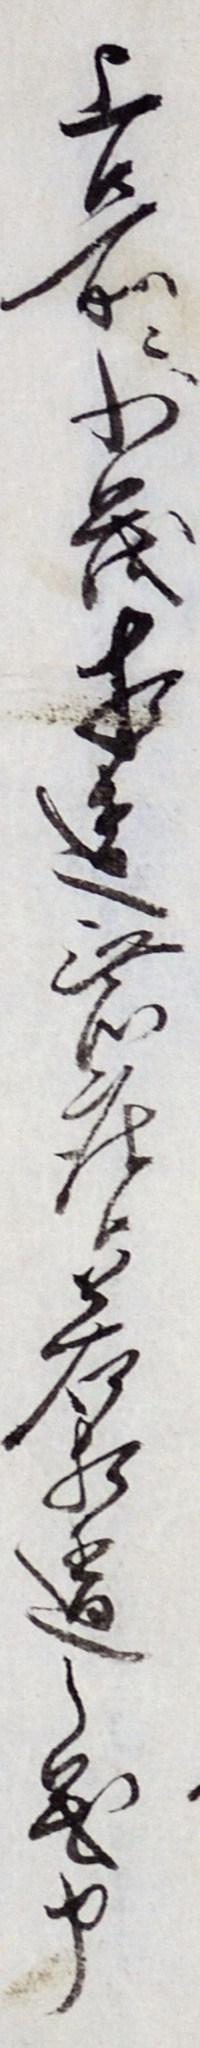上候所ニ少も相違無御座候若相違之義申
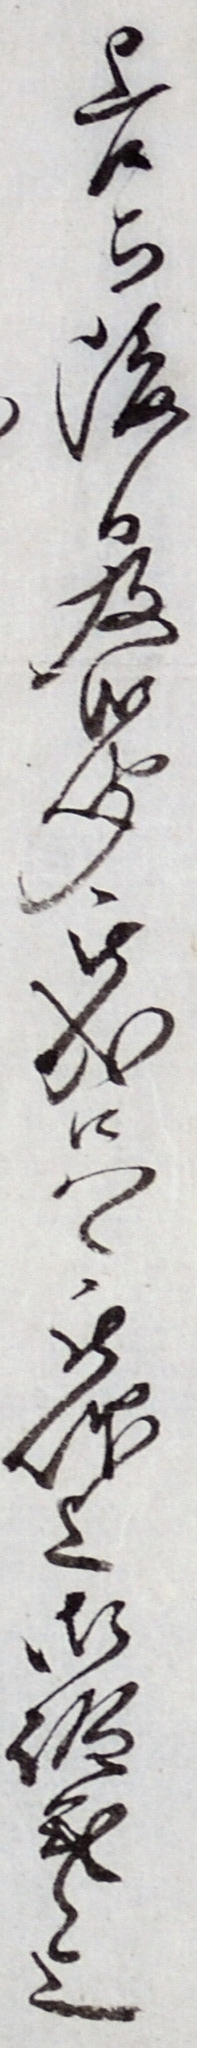上候と後日及御聞被成候ハヽ被仰上御詮義之上
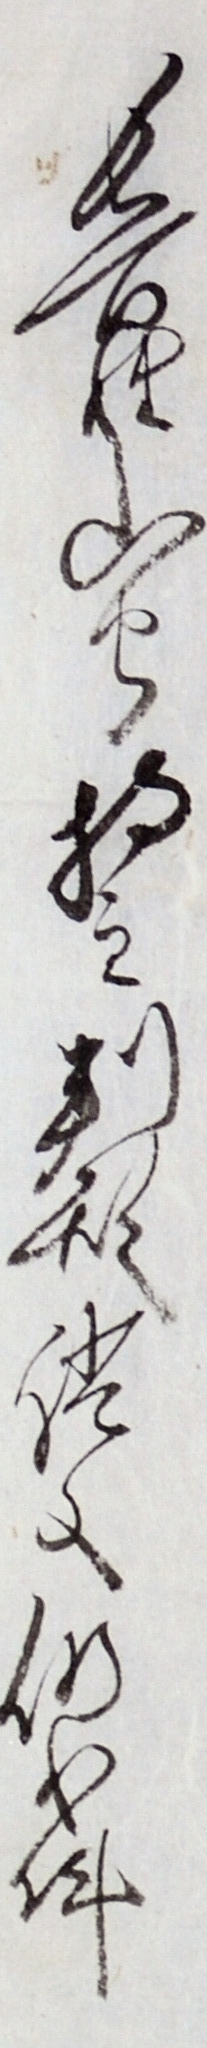長百姓山守持主判形証文仍如件
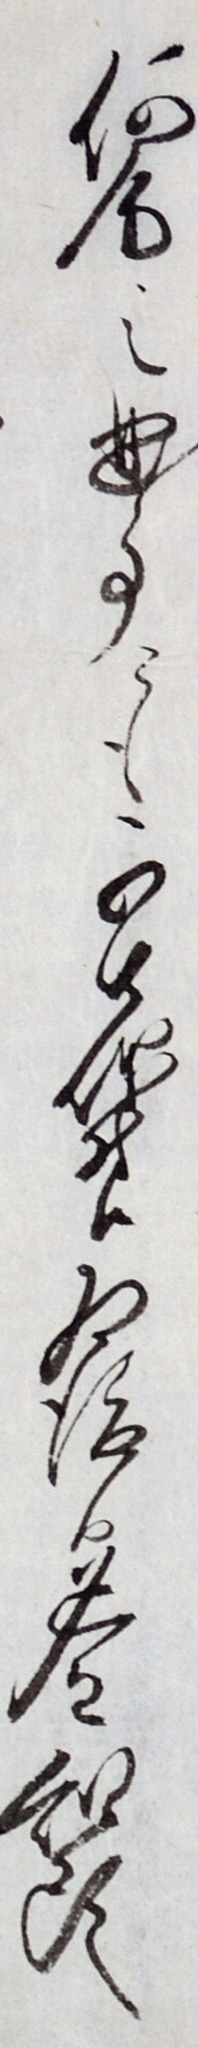何分之曲事ニも可被仰付候為後日名主組頭
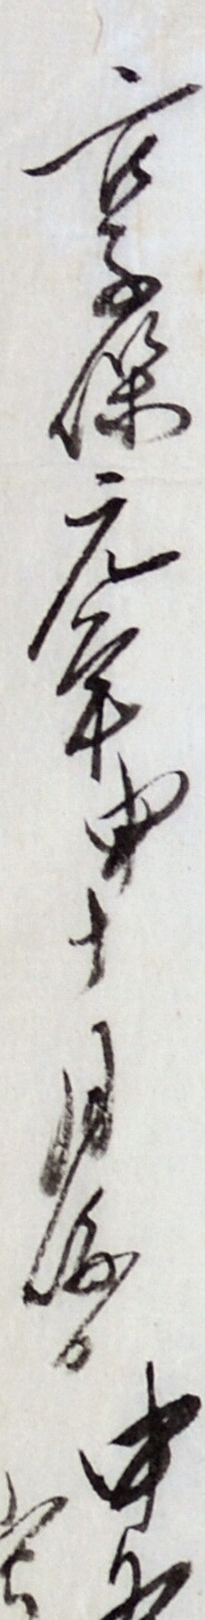享保元年申十月晦日中条村

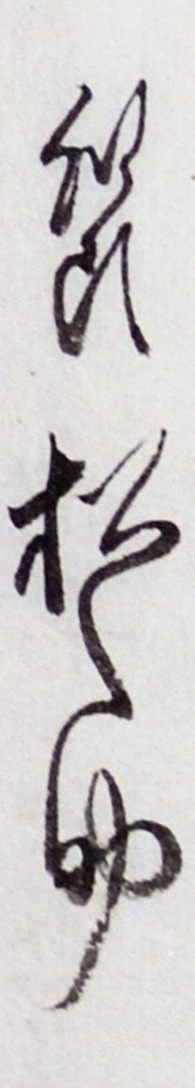組頭松之助
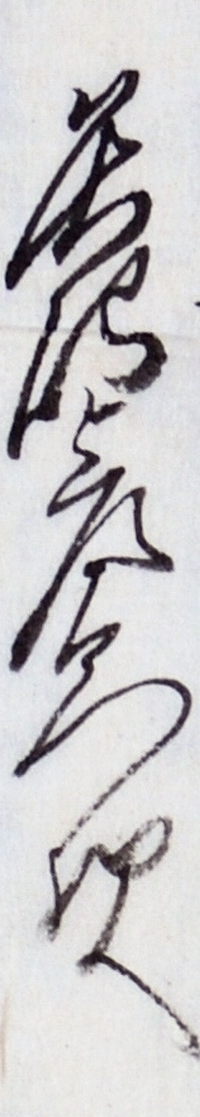矢嶋彦右衛門様
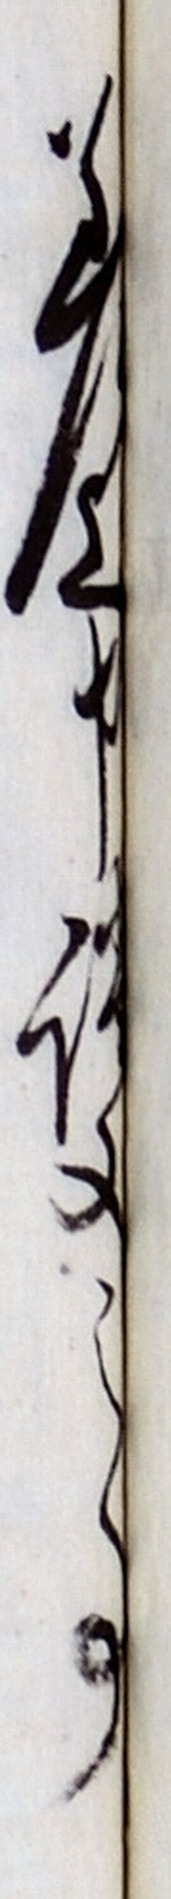差上申証文之事
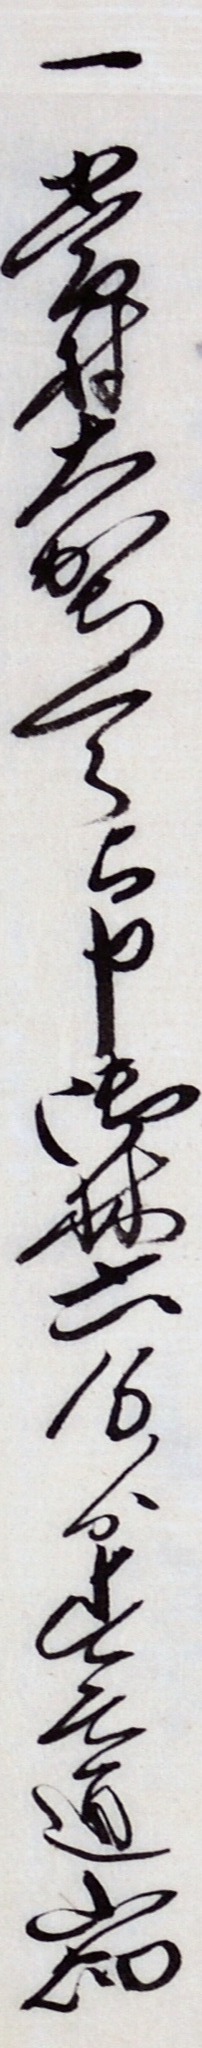一当村大かちくら与申御林六分ゟすそ道山畑
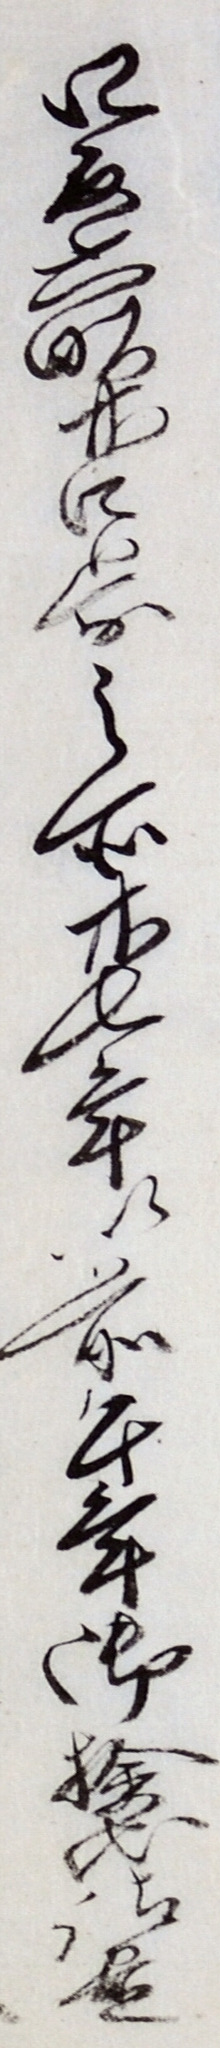四反六畝廿四歩之所廿七年以前午年御検地註進
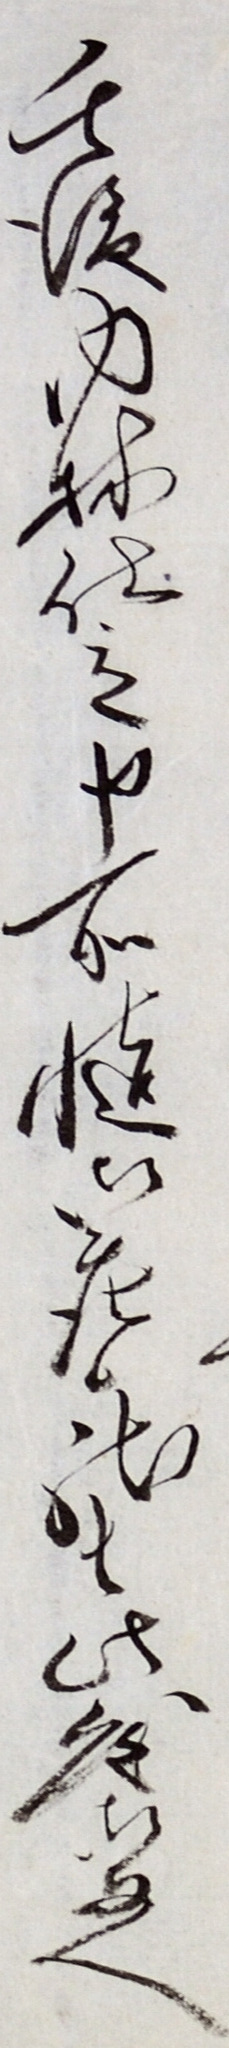其後内林仕立申所慥御座候然は此度御両人
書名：御林御竹藪証文控
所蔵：伊那市立高遠町図書館・合同会社AMANE
